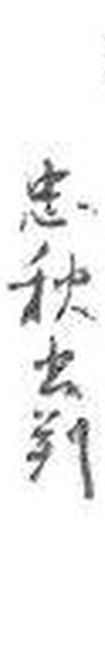忠秋書判
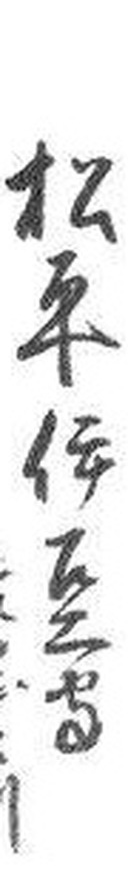松平伊豆守
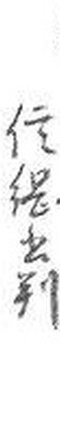信綱書判
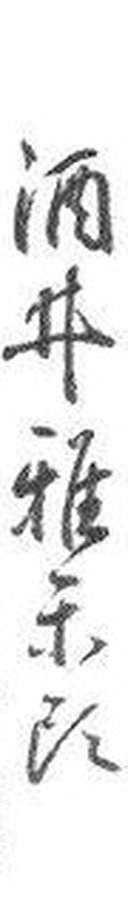酒井雅楽頭
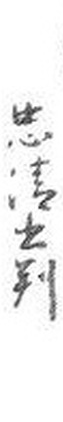忠秋書判
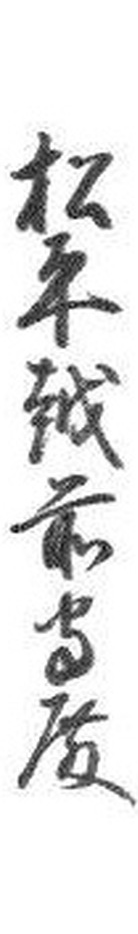松平越前守殿
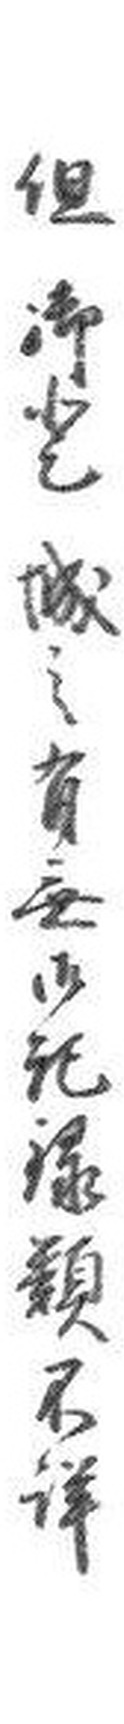但御登城之有無御記録類不詳
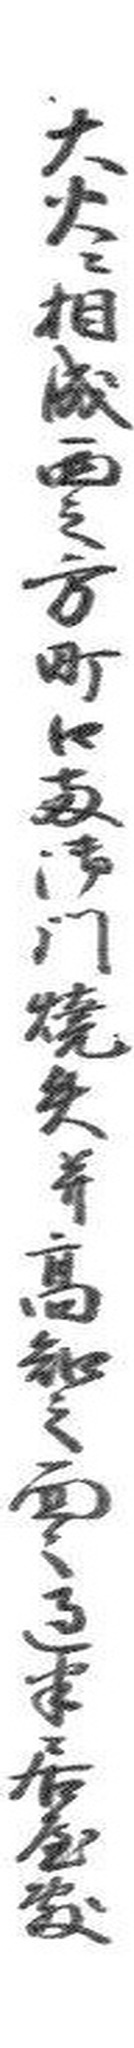大火ニ相成西之方町口両御門焼失并高知之面々過半居屋敷
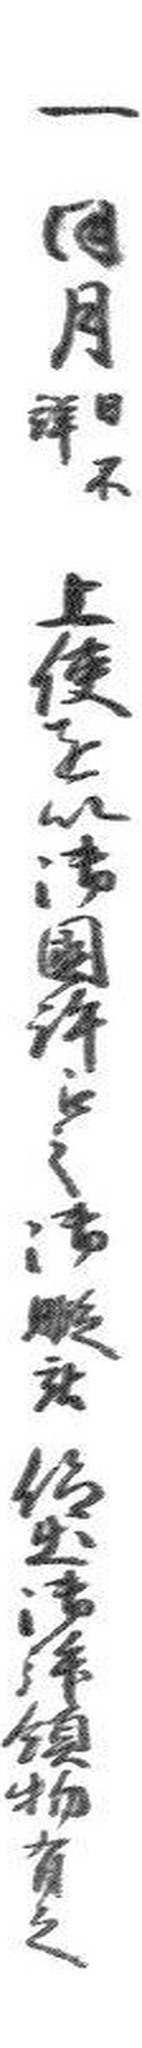一同月日不詳上使を以御国許江之御暇被仰出御拝領物有之
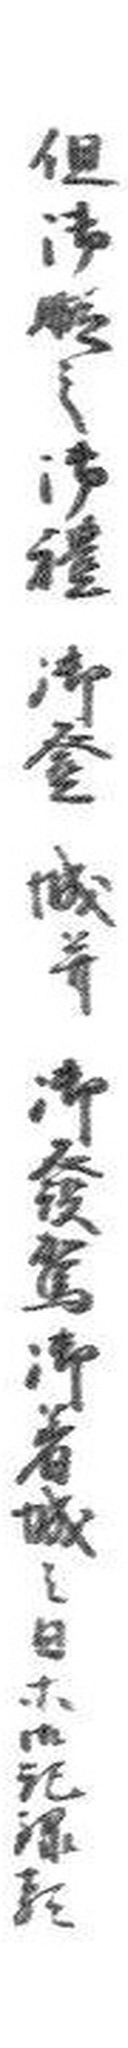但御暇之御礼御登城并御発駕御着城之日等御記録類
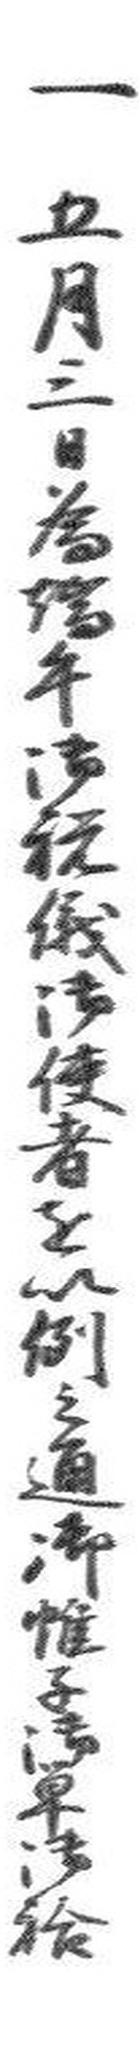一五月三日為端午御祝儀御使者を以例之通御帷子御単御袷
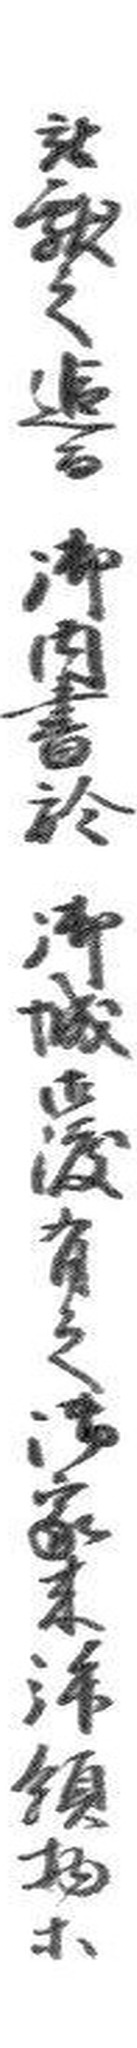被献之追而御内書於御城御渡有之御家来拝領物等

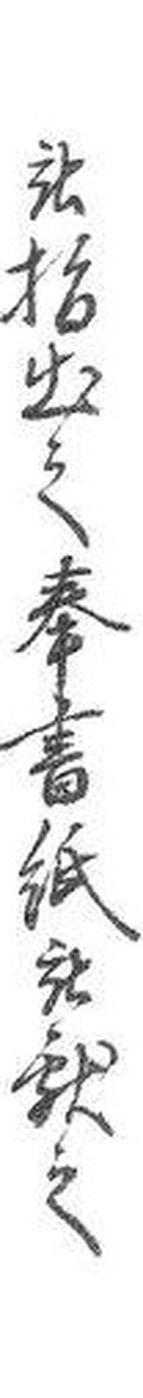被指出之奉書紙被献之
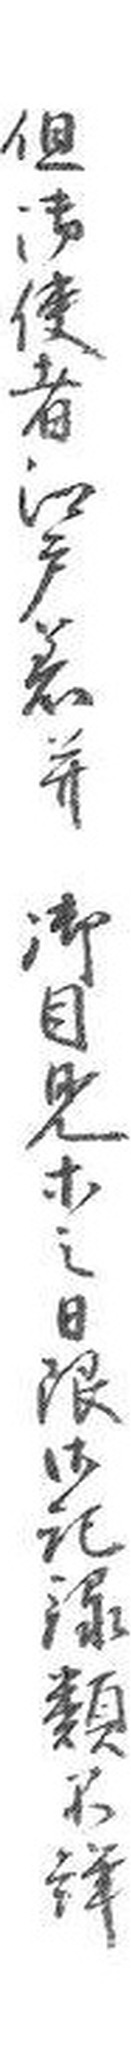但御使者江戸着并御目見等之日限御記録類不詳
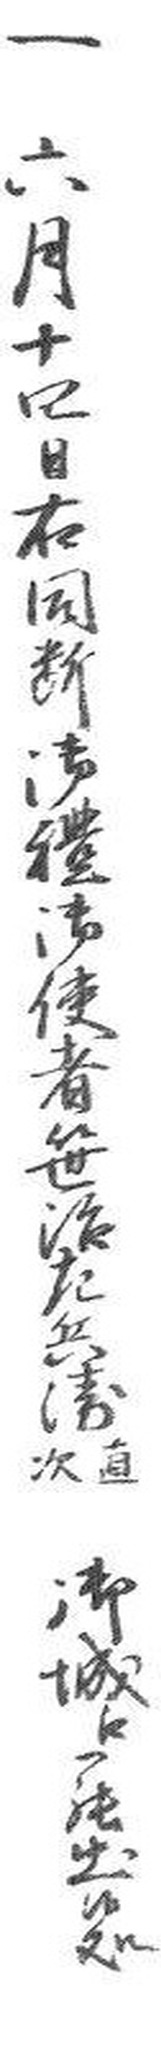一六月十四日右同断御礼御使者笹治左兵衛直次御城江罷出候処
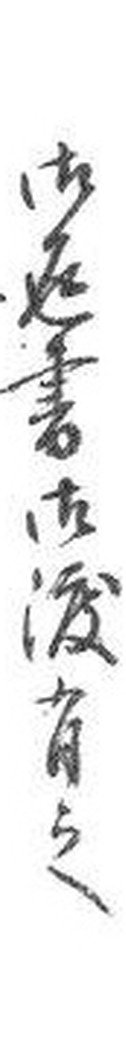御返書御渡有之
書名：家譜 五 光通公 従寛永十三年到万治二年
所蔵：福井県文書館 Fukui Prefectural Archives
